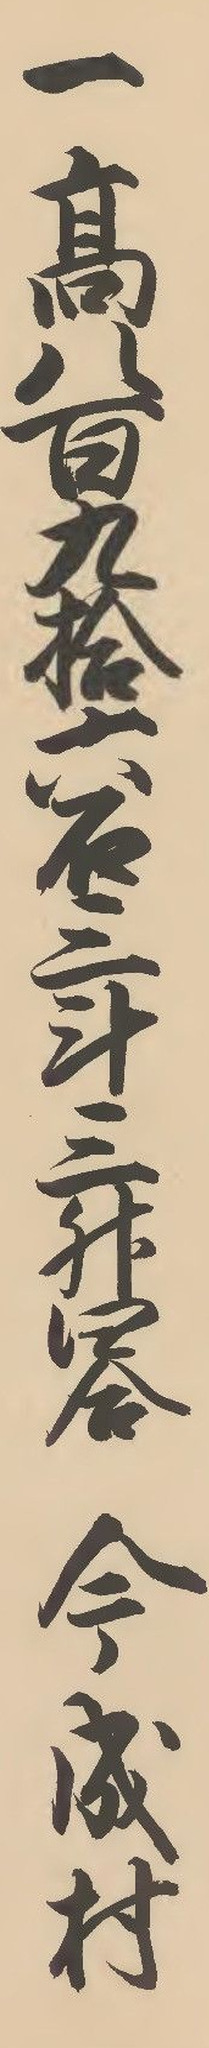一高八百九拾六石三斗三升四合今成村
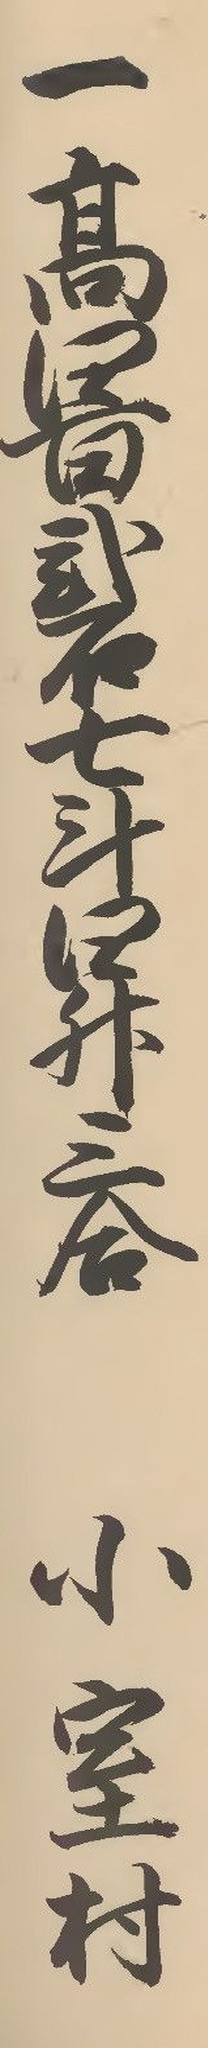一高四百弐石七斗四升三合小室村
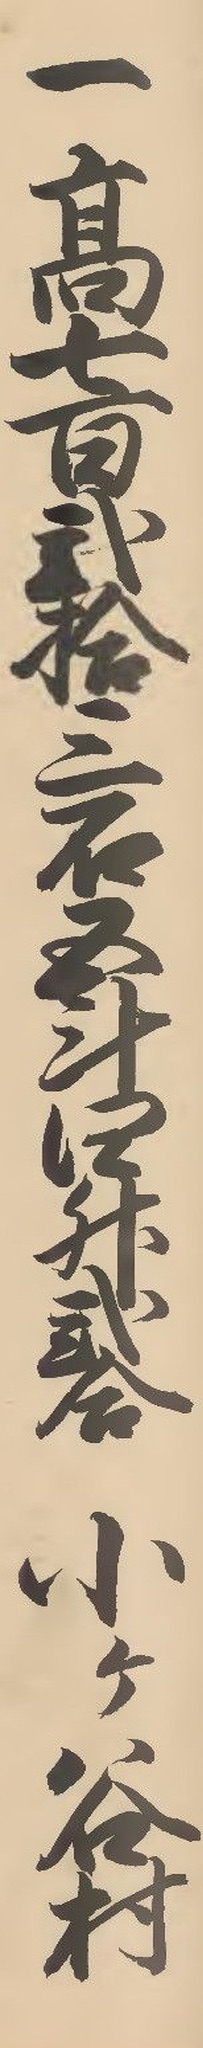一高七百弐拾三石五斗四升弐合小ヶ谷村
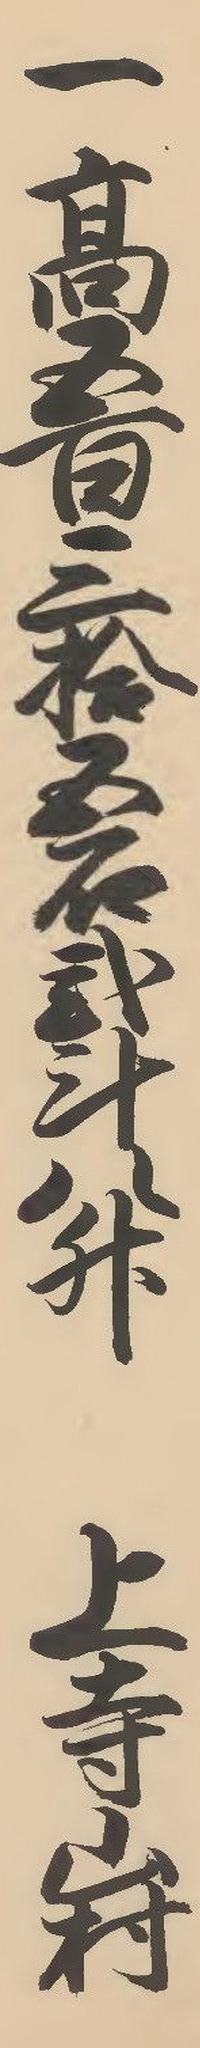一高五百三拾五石弐斗八升上寺山村
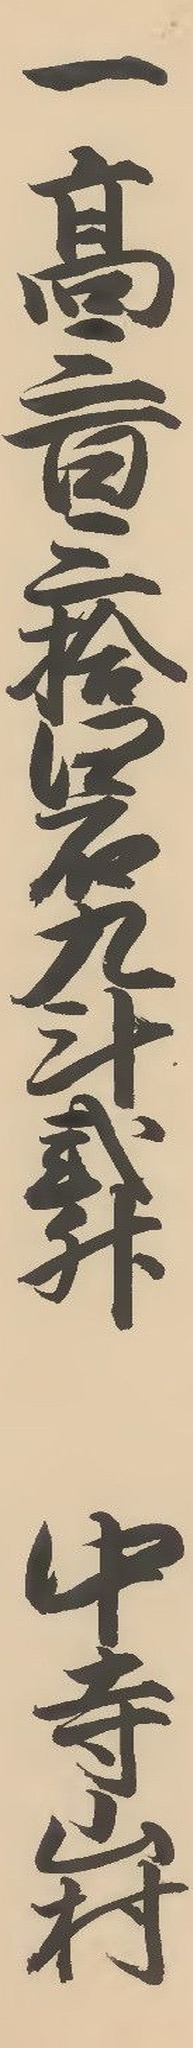一高三百三拾四石九斗弐升中寺山村
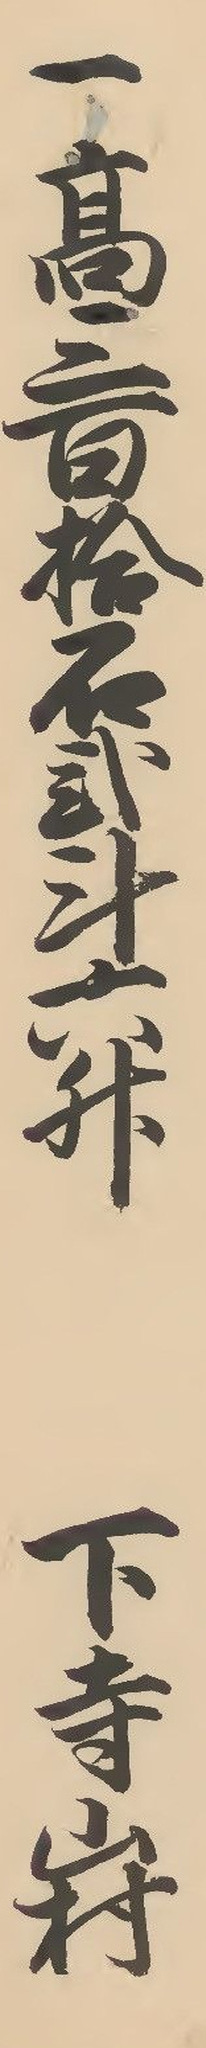一高三百拾石弐斗六升下寺山村

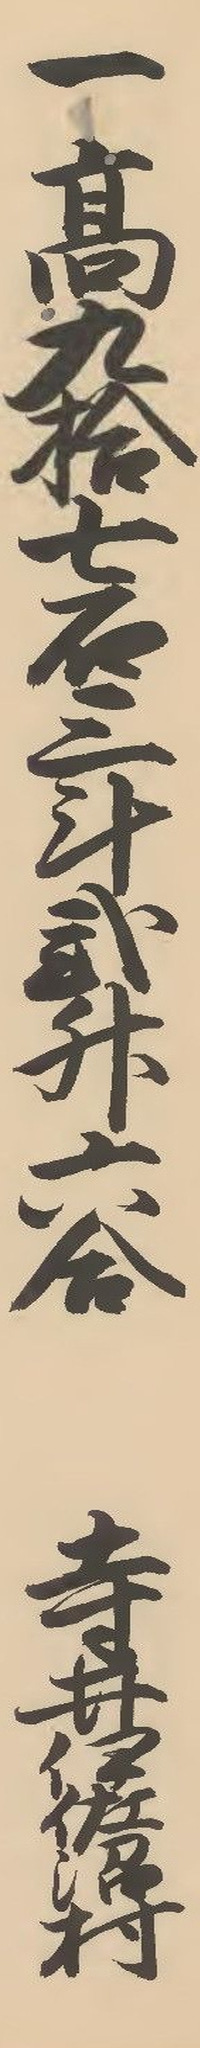一高九拾七石三斗弐升六合寺井伊佐沼村
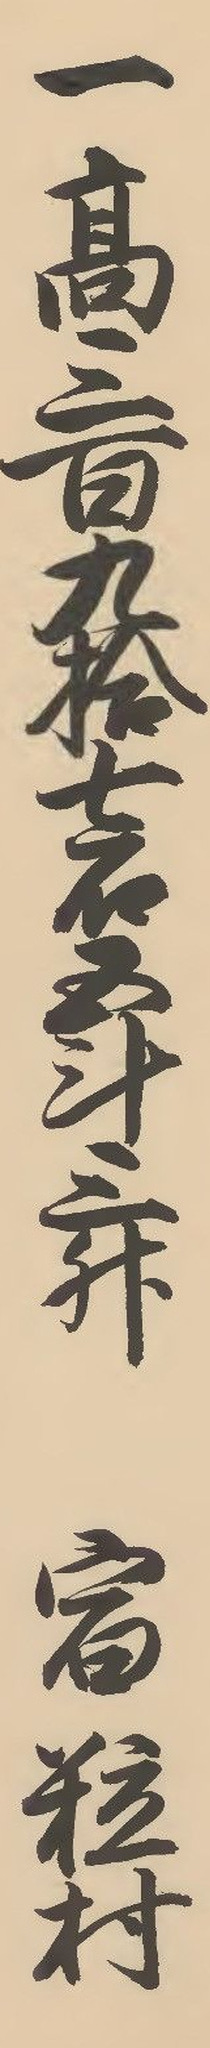一高三百九拾七石五斗三升宿粒村
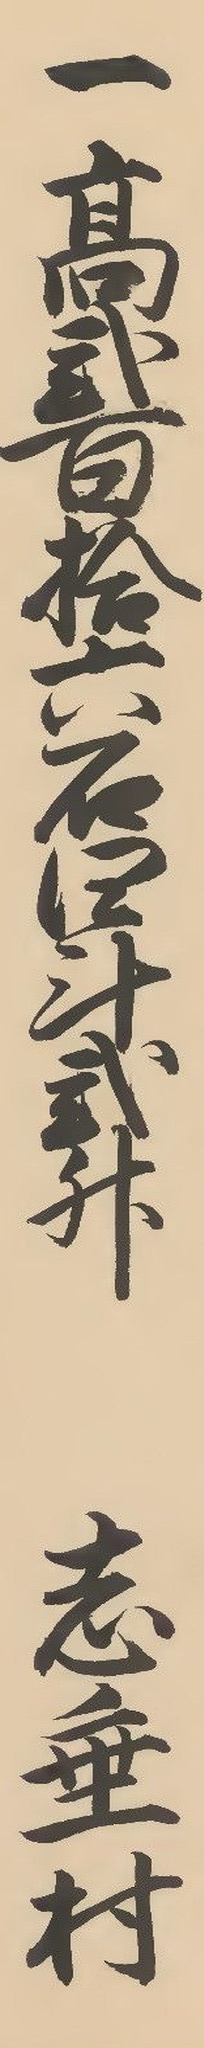一高弐百拾六石四斗弐升志垂村
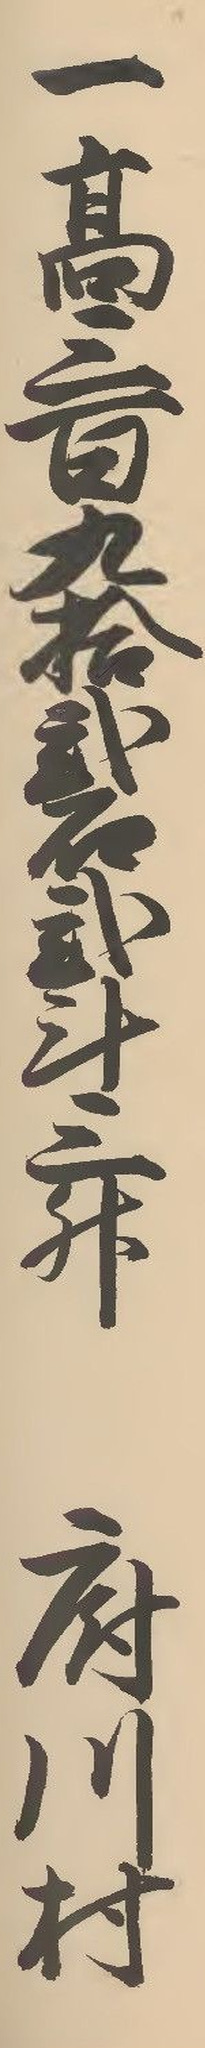一高三百九拾弐石弐斗三升府川村
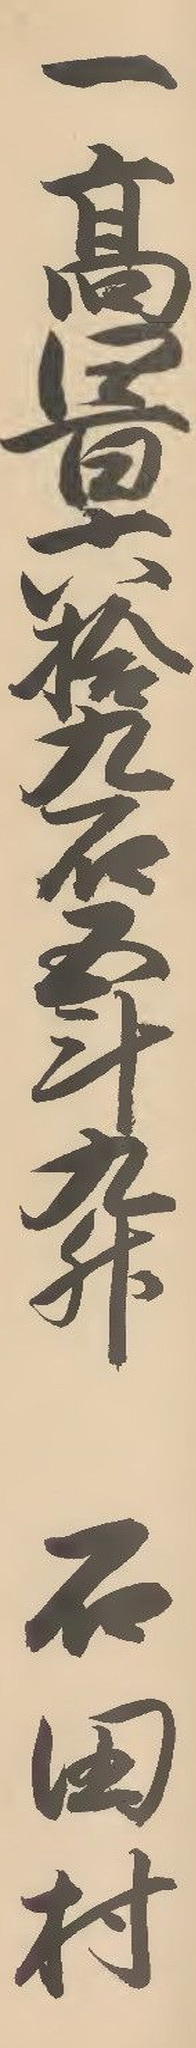一高四百六拾九石五斗九升石田村
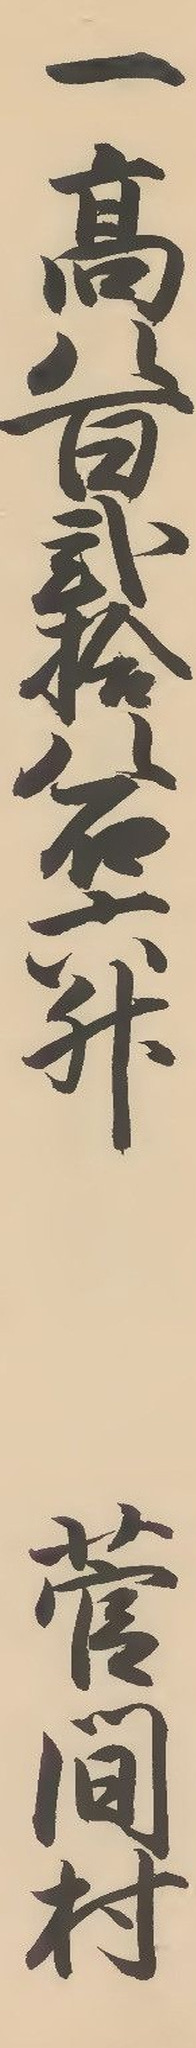一高八百弐拾八石六升菅間村
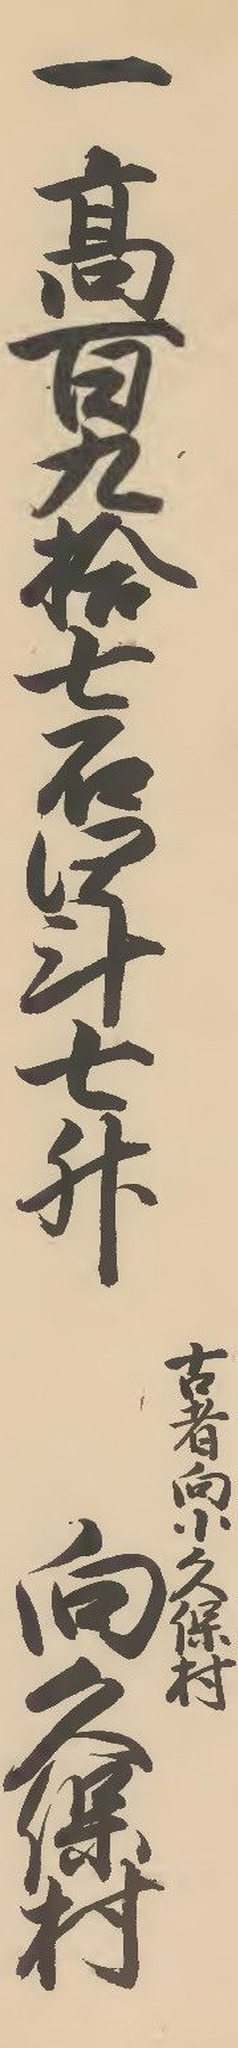一高百九拾七石四斗七升向久保村
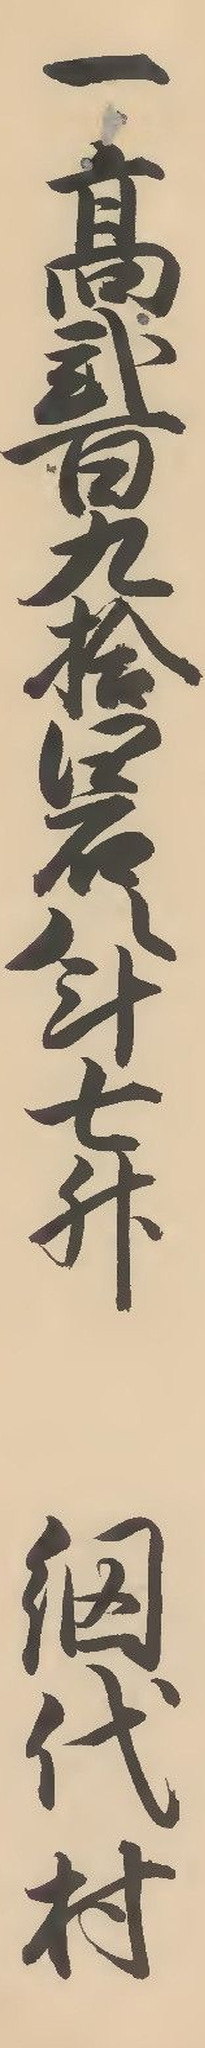一高弐百九拾四石八斗七升網代村

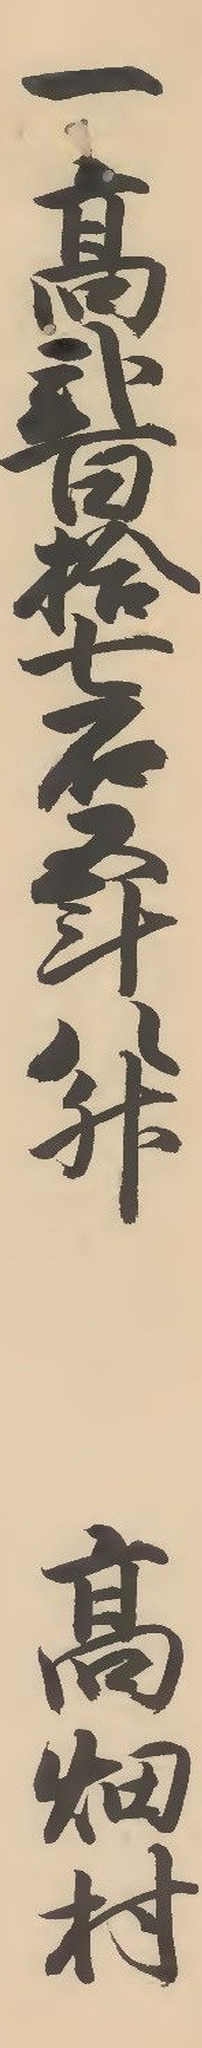一高弐百拾七石五斗八升高畑村
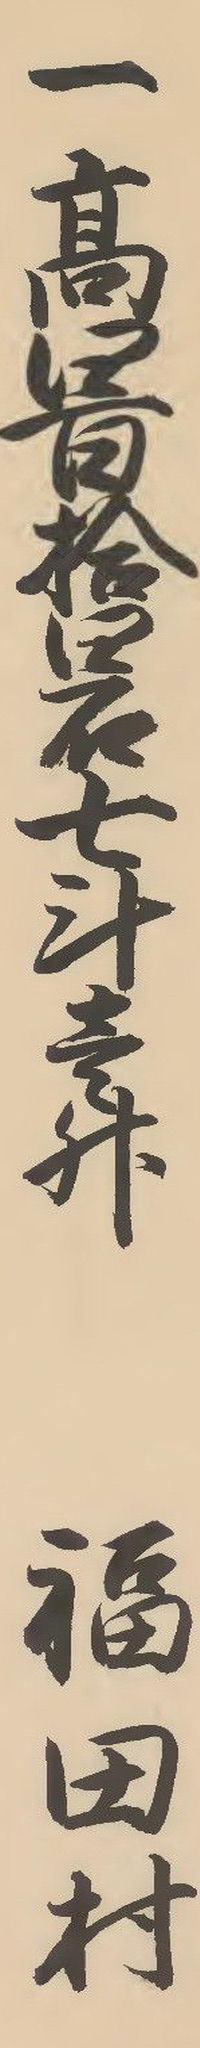一高四百拾四石七斗壱升福田村
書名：武蔵国郷帳　上
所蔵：国立公文書館 National Archives of Japan
